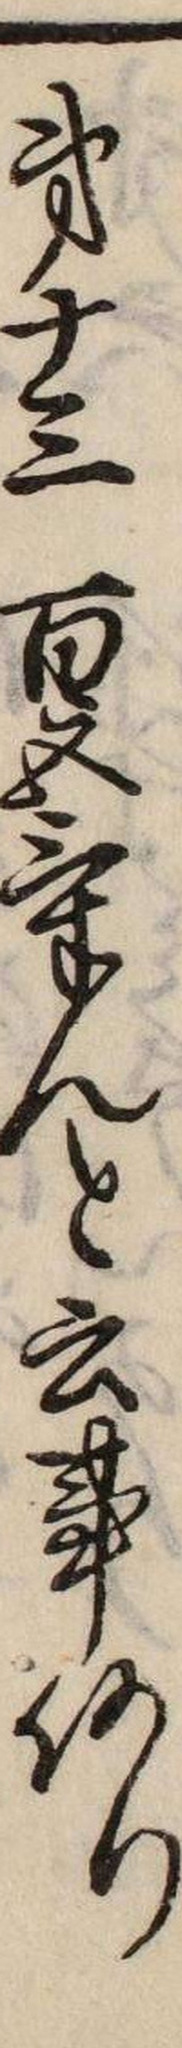第十三百五けんと云事あり
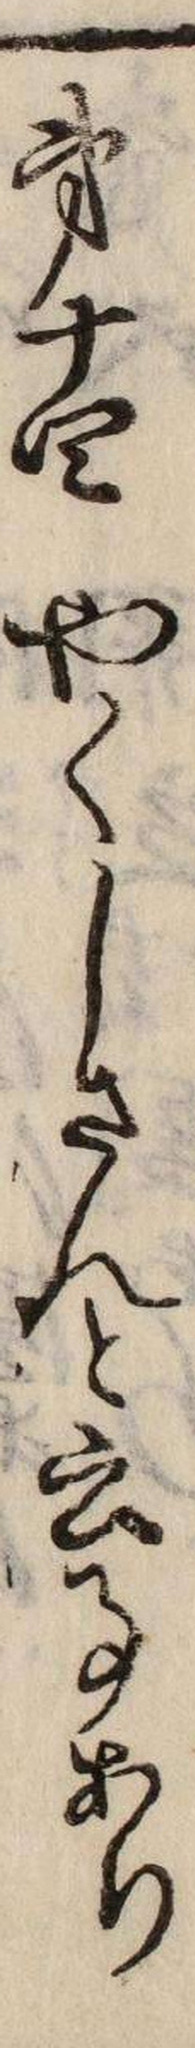第十四やくしさんと云事あり
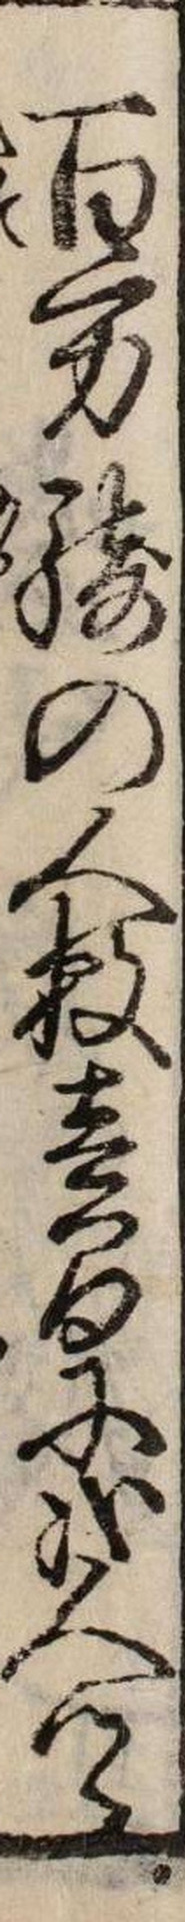百万騎の人数壱間に弐人つつ
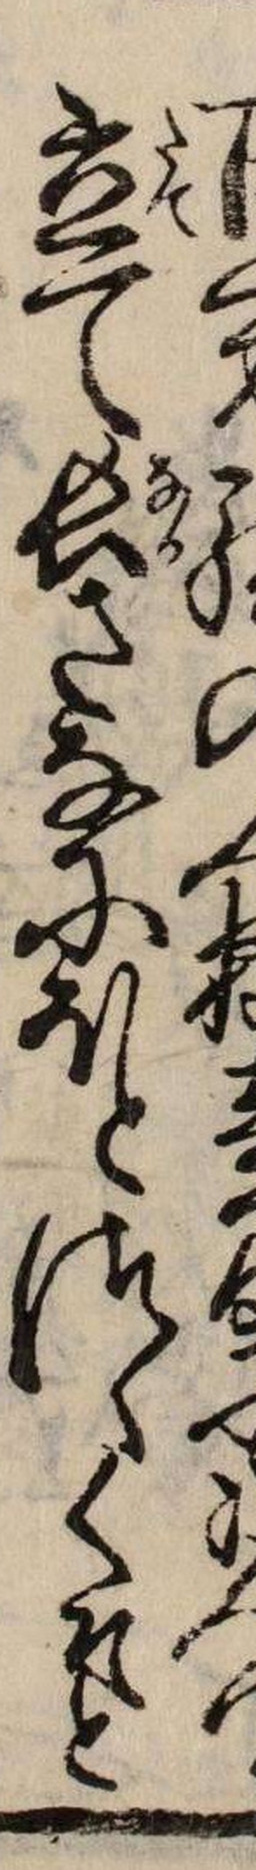立て長さなにほとつつくそと
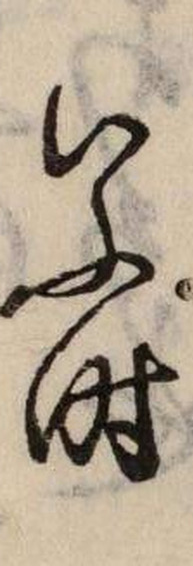いふ時
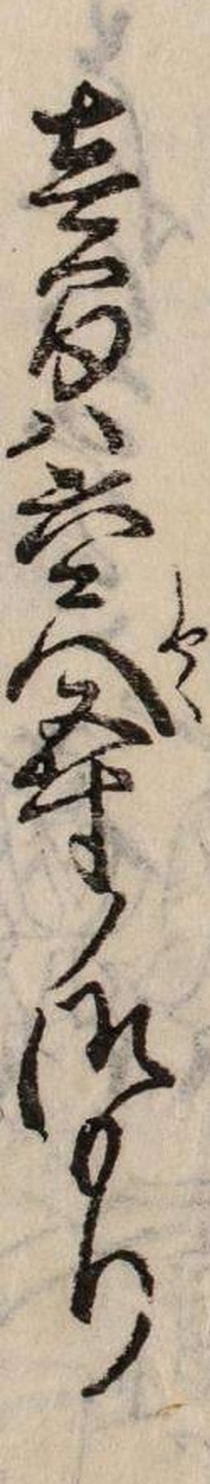壱間は六尺五寸のつもり
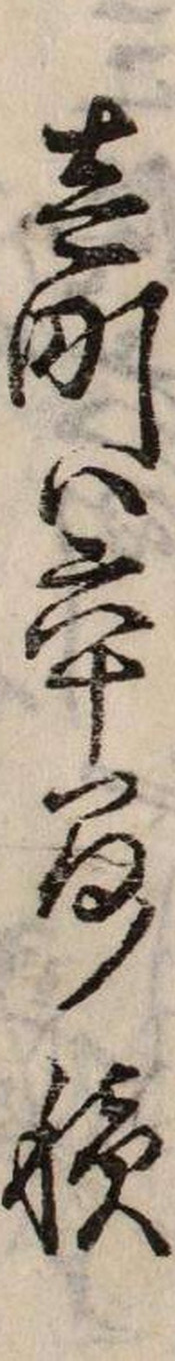壱町は六十間の積
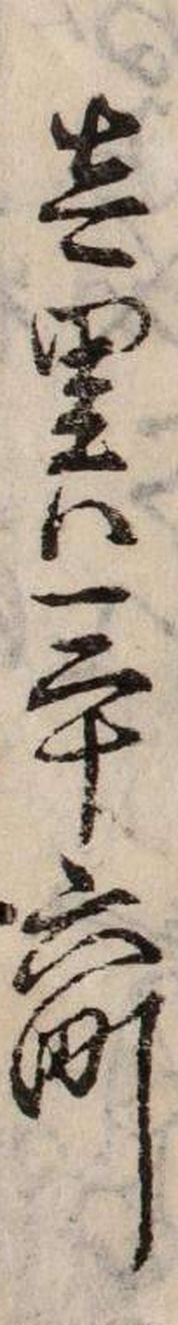壱里は三十六町
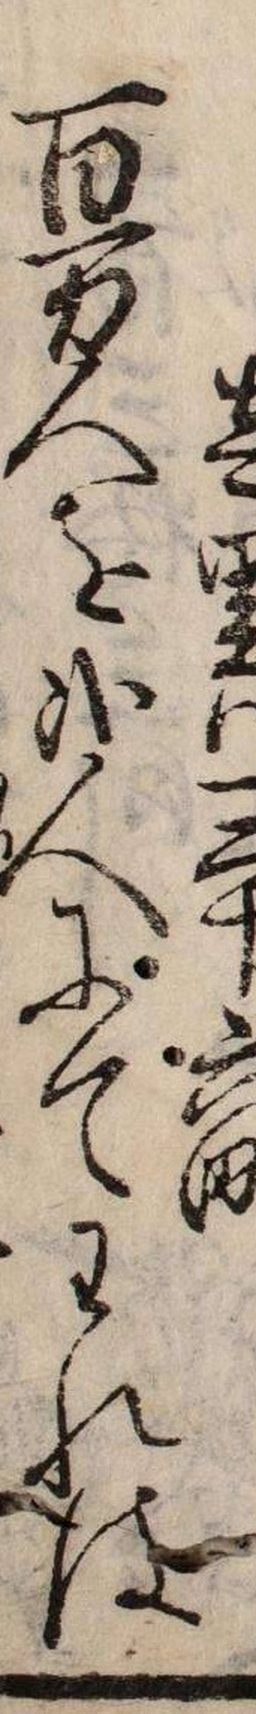百万人を弐人にてわれは
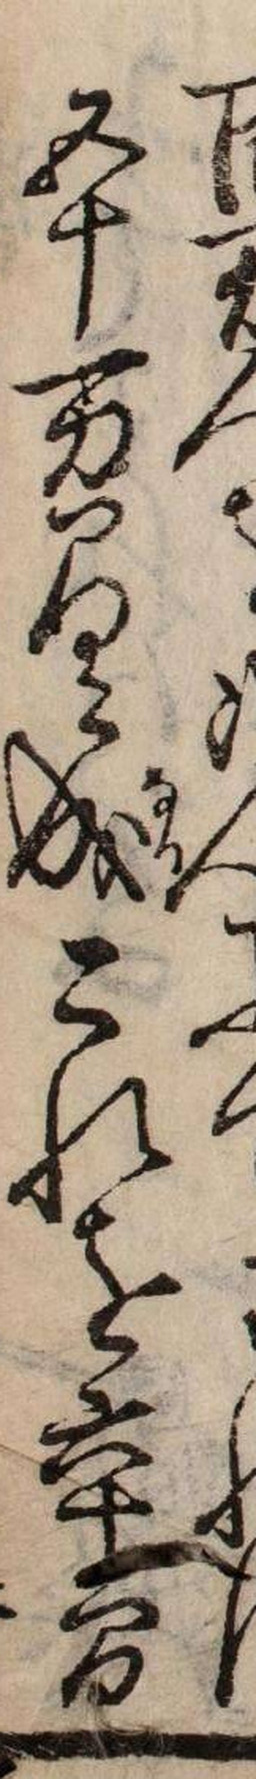五十万間に成これを六十間

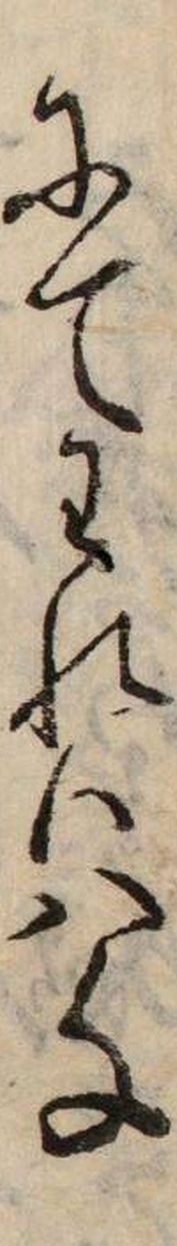にてわれは八千
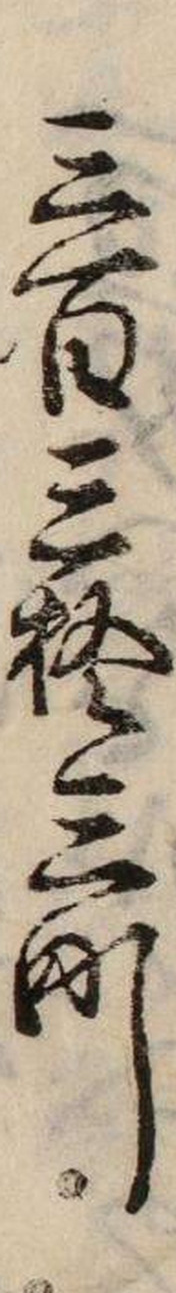三百三拾三町
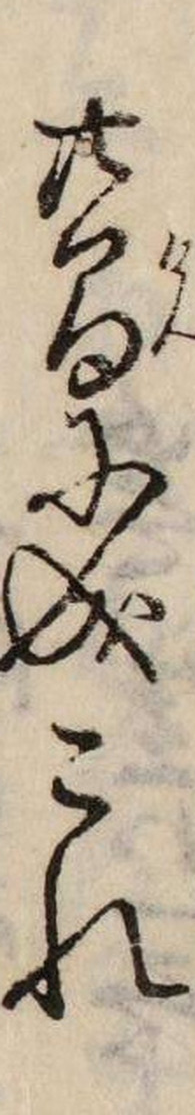廿間に成これ
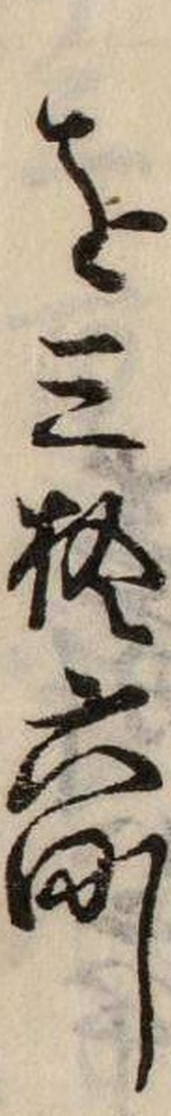を三拾六町
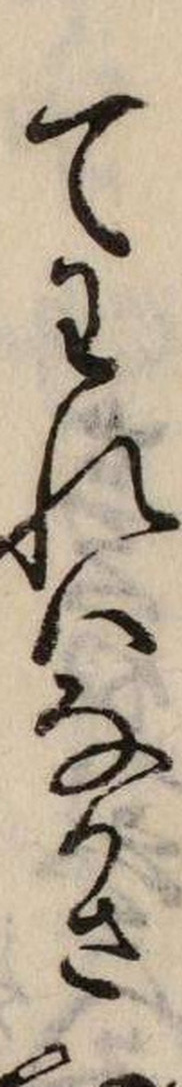てわれはなかさ
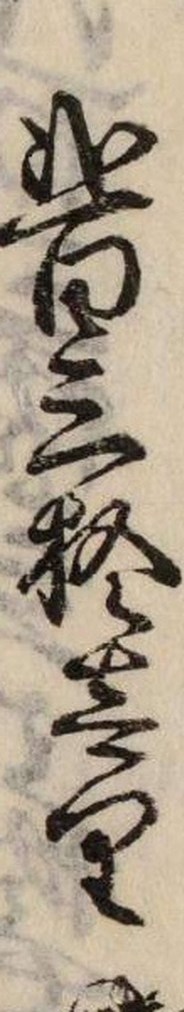弐百三拾壱里
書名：塵劫記（寛永11年自跋、京都府立京都学・歴彩館追貴8）
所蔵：京都府立京都学・歴彩館 国文学研究資料館
